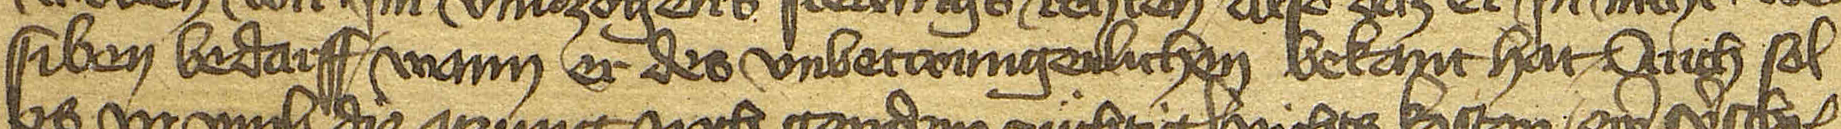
ſiben bedarff / wann er des vnbetwungenlichen bekant hat / Auch ſol
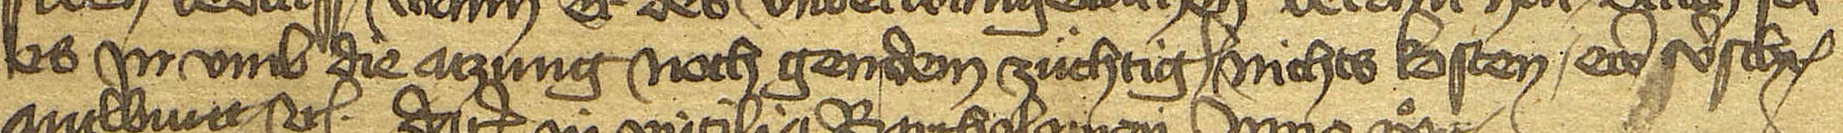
es In vmb die acʒung noch gen dem cʒüchtig* nichts koſten / ew* v*ſchr*
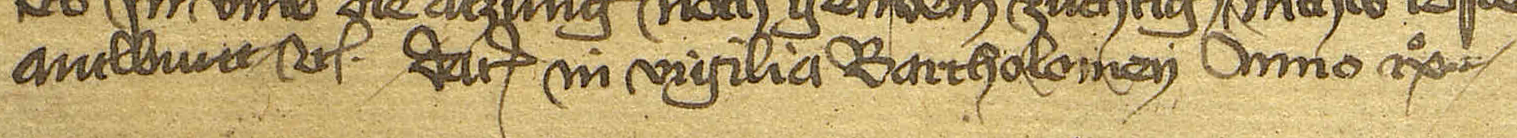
antwurtt / ec* . / Dat* in vigilia Bartholomey Anno ix* - /
